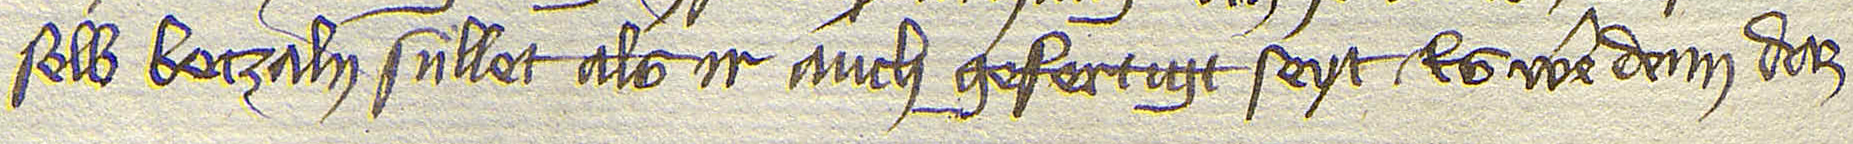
ſelb becʒaln* ſüllet als ir auch gefertigt ſeyt / Es w*e denn daʒ
